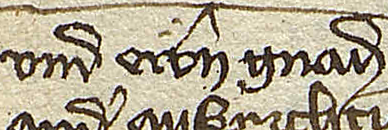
vnd ew*n gnad*
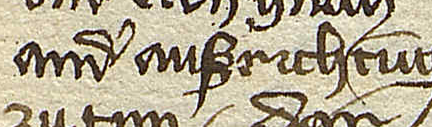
and* auſʒrichtu*g
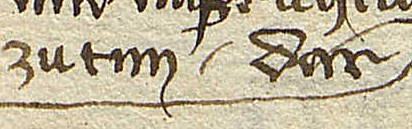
ʒu tun / dar
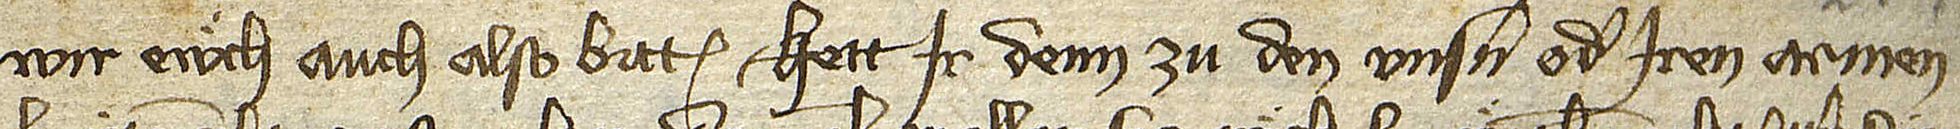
wir eẅch auch alſo bitt* / hett Ir dem ʒu den vnſn* od* Iren armen
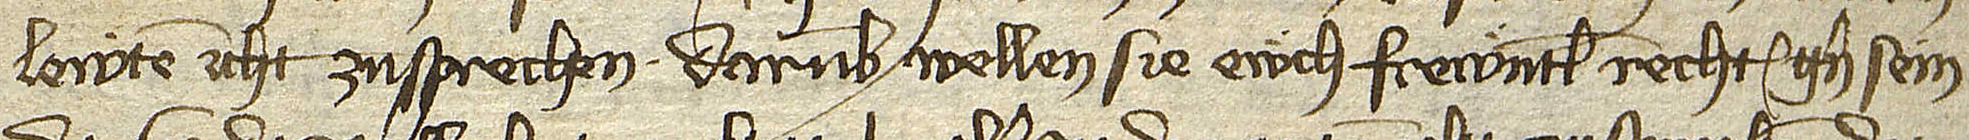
leẅte* icht ʒuſprechen . darüb* wellen ſie eẅch freẅntl* recht* gn* ſein
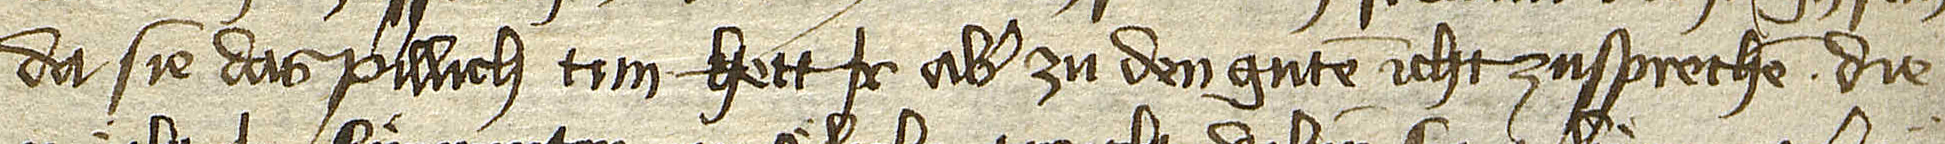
da ſie das pillich tun hett Ir ab* ʒu den gute* icht ʒuſpreche* . die
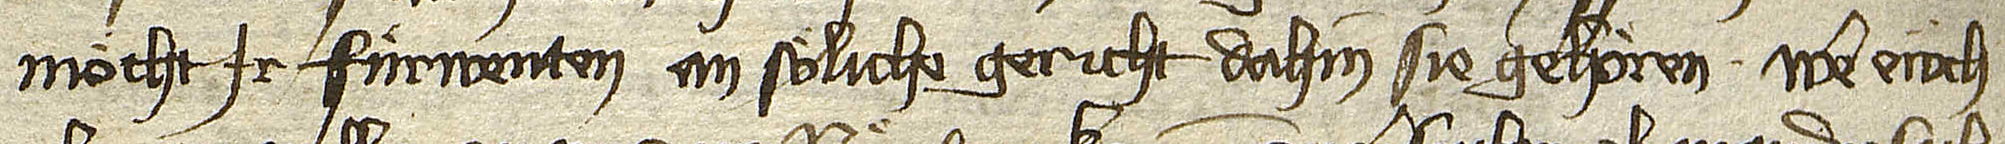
möcht Ir fürwenten an ſöliche gericht dahin ſie gehören . we* eẅch
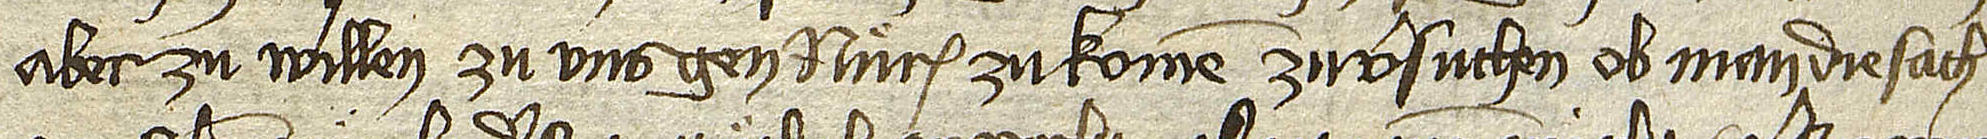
aber ʒu willen ʒu vns gen Nür* ʒu kome* ʒuvſuchen* ob man die ſach
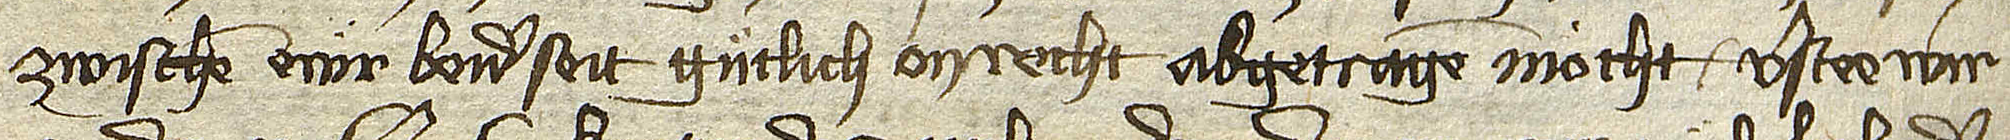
ʒwiſche* eẅr beid*ſeit gütlich onrecht abgetrage* möcht / vſtee* wir wir
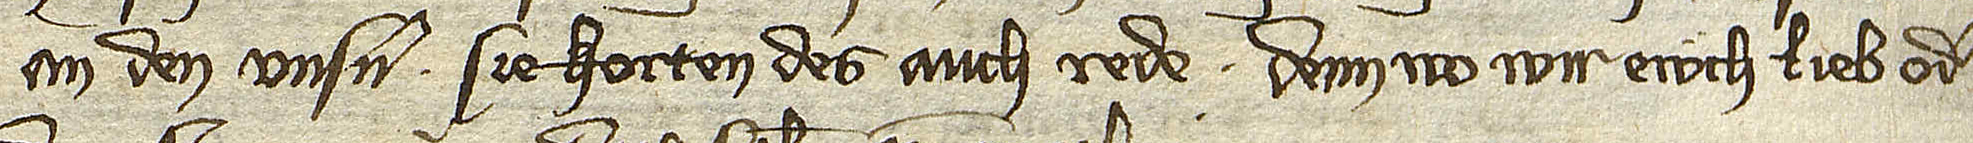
an den vnſn* . ſie horten des auch rede . denn wo wir eẅch lieb od*
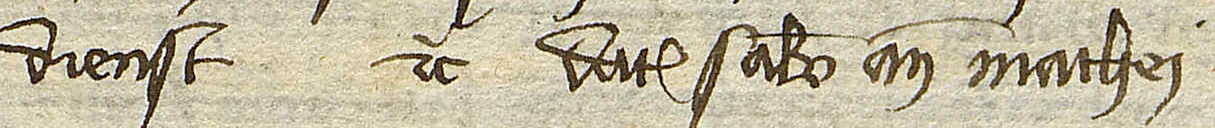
dienſt ec* Dat* ſabo* an* mathei
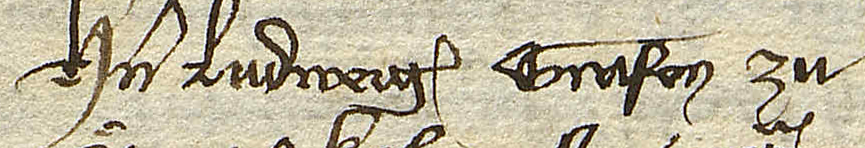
Hn* Ludweig* Grafen ʒu
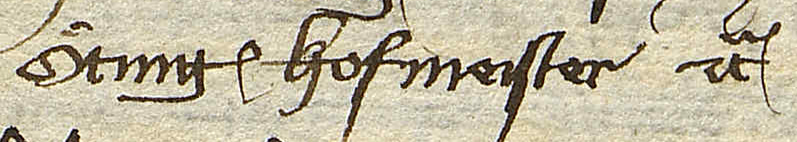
Öting* hofmeiſter ec*
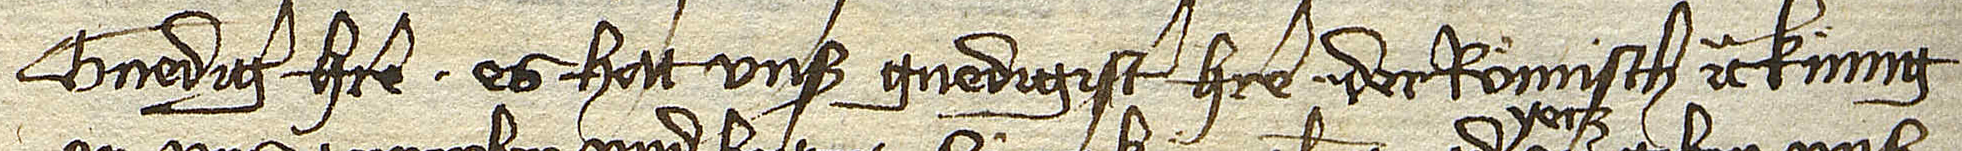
Gnedig* hre* . es hat vnſ* gnedigiſt* hre* . der Römiſch ec* künig
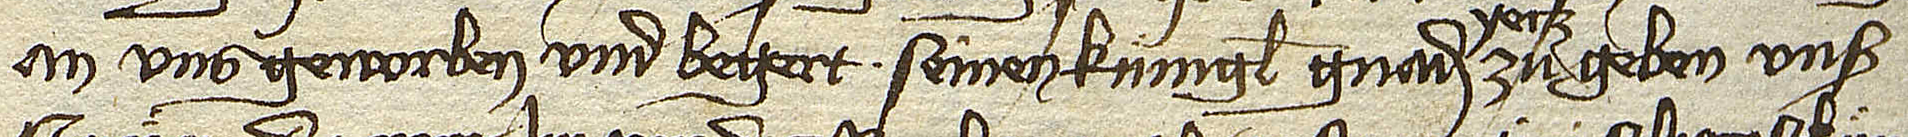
an vns geworben vnd begert . ſeinen künigl* gnad* ʒu geben vnſ*
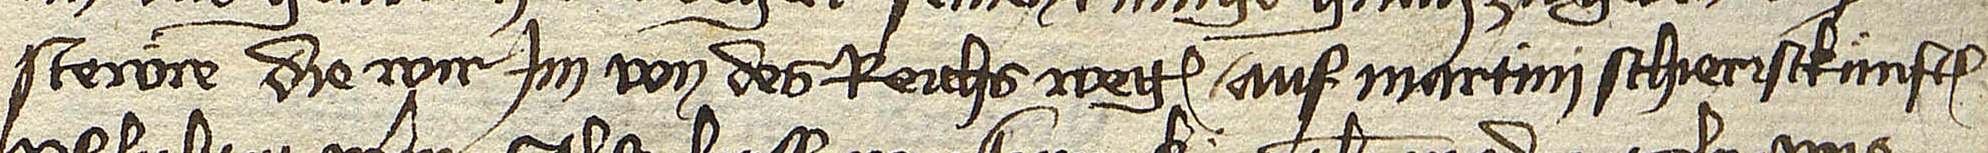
ſteẅre die wir Im von des Reichs weg* / auf martini ſchieriſtkünft*
